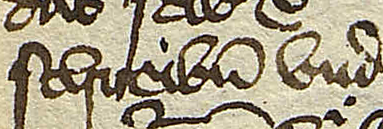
ſchreibn* vnd
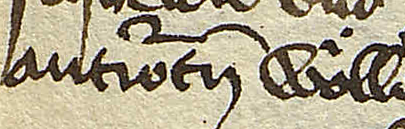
antw*tn* wölle
